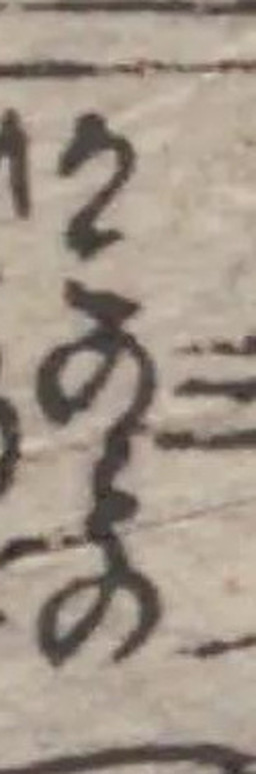かこのもの
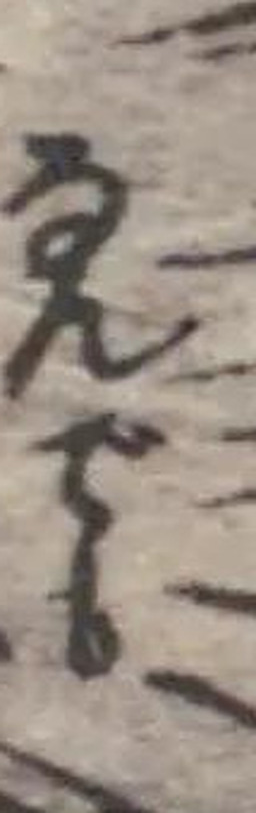なんでも
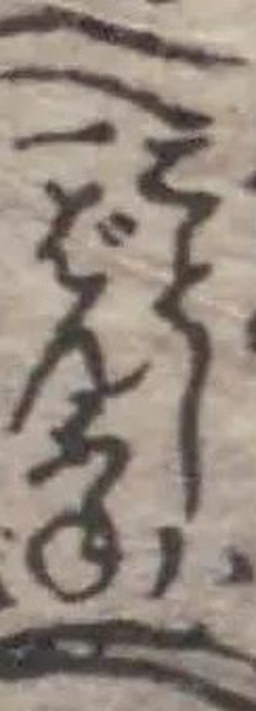一ばんふね

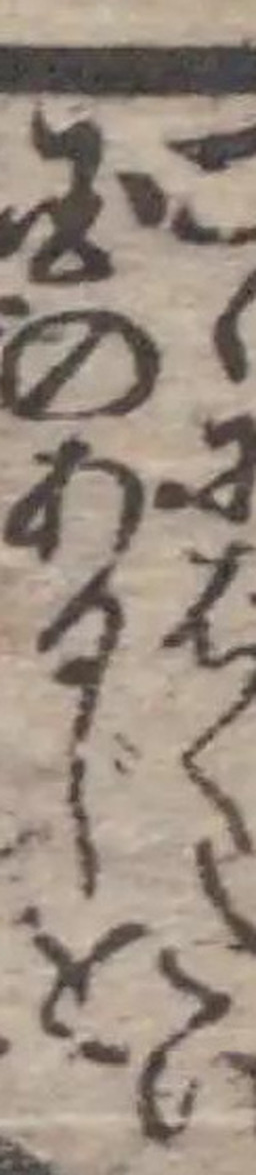国のあるじを
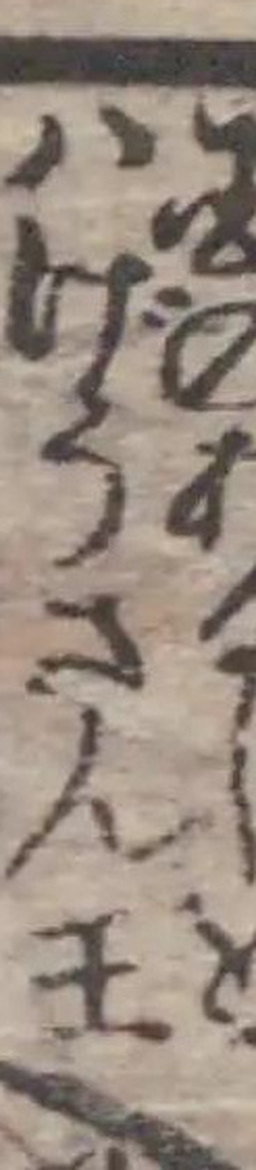はげうさん王
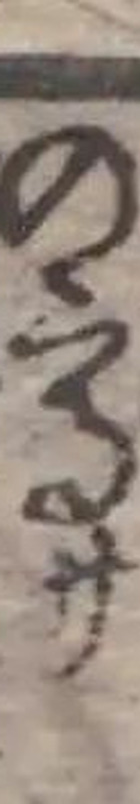の高さ
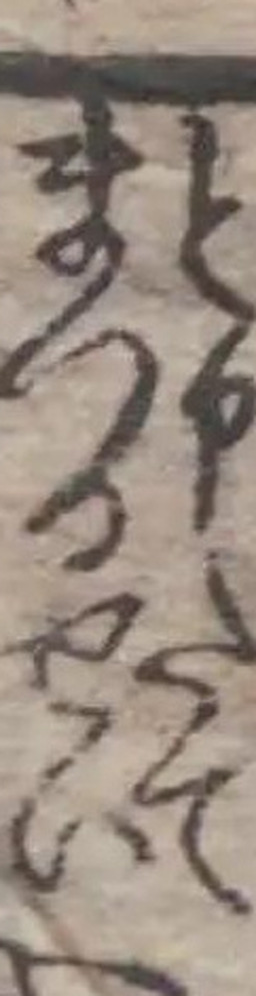まつるせい
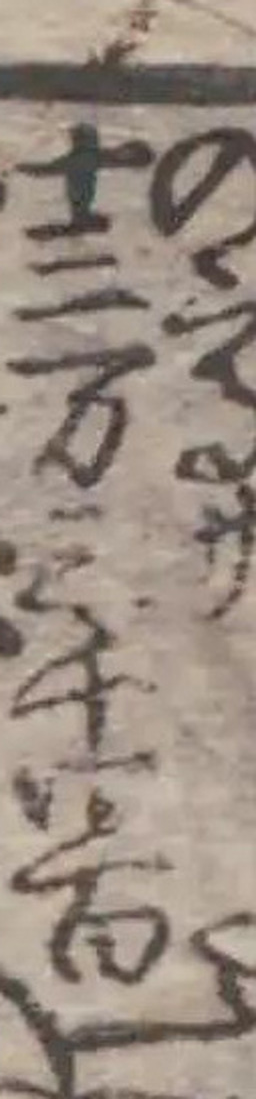十三万三千四百
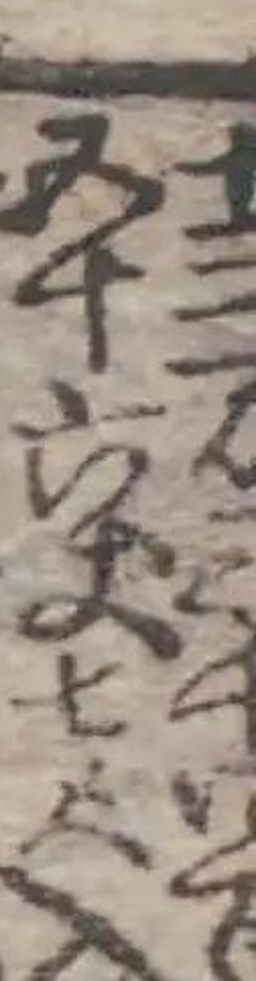五十六丈七尺
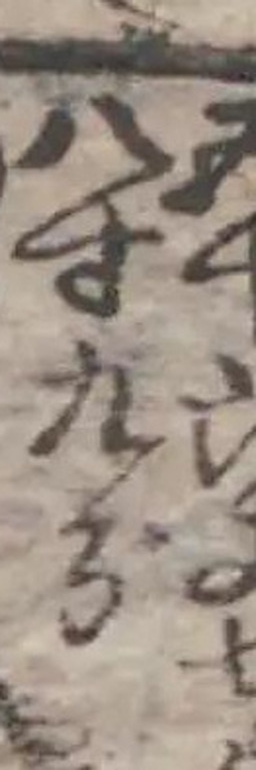八寸九分
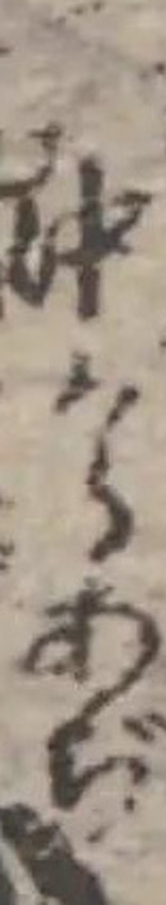中からあぢ
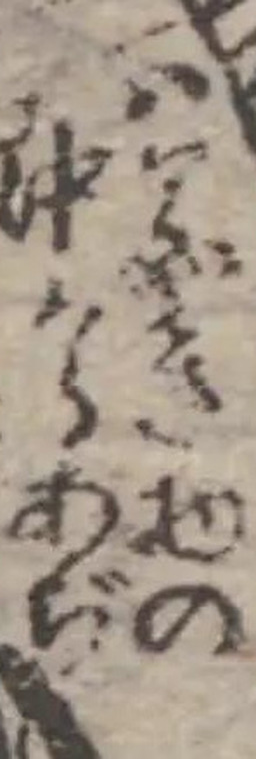中からあぢ
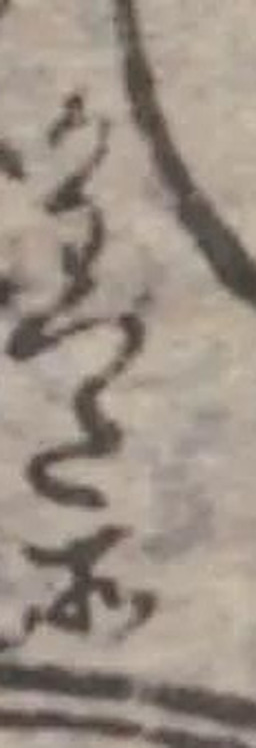かわつた所
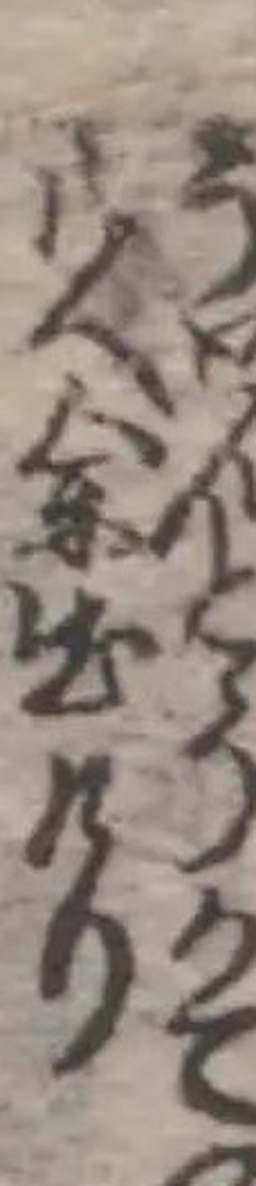人余出けり
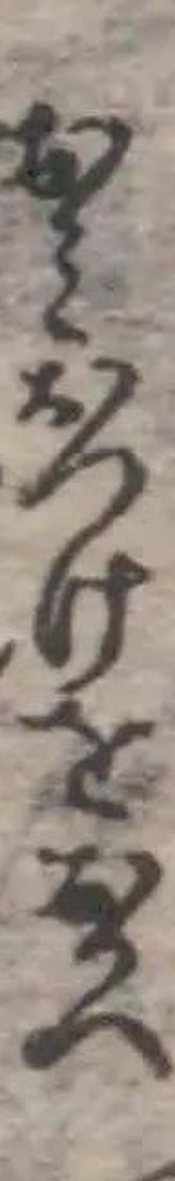おみおつけをおかへ
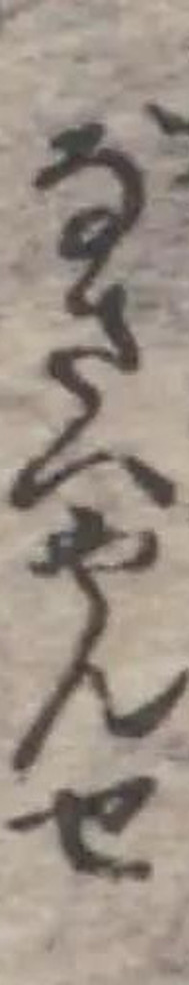なさへやんせ
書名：五たいそう
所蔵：国立国会図書館 National Diet Library, JAPAN
